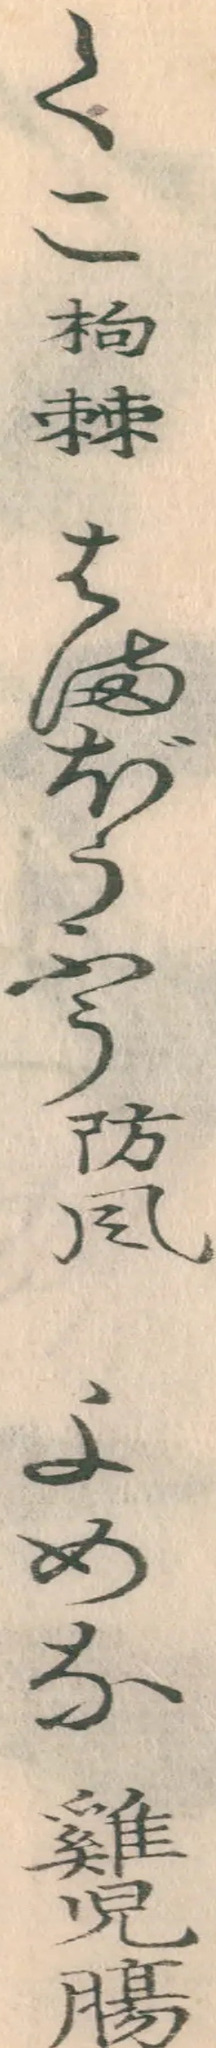くこ枸棘はまぼうふう防風よめな鶏児腸
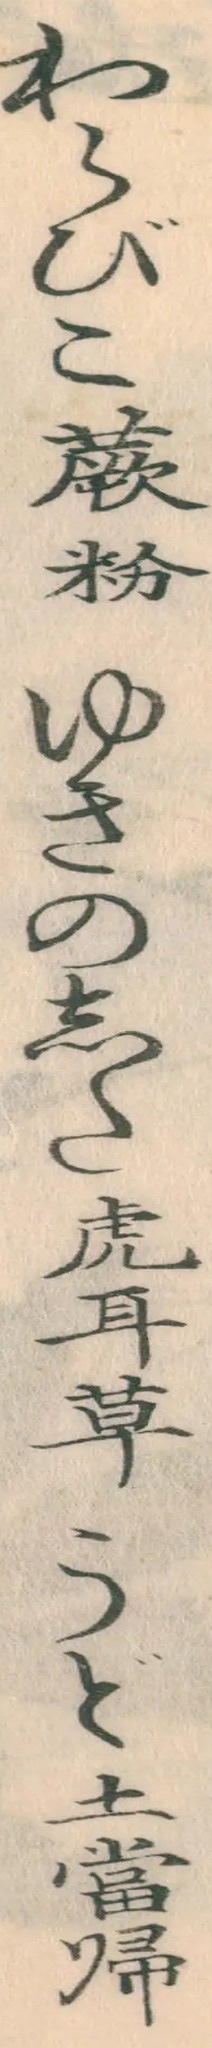わらびこ蕨粉ゆきのした虎耳草うど土当帰
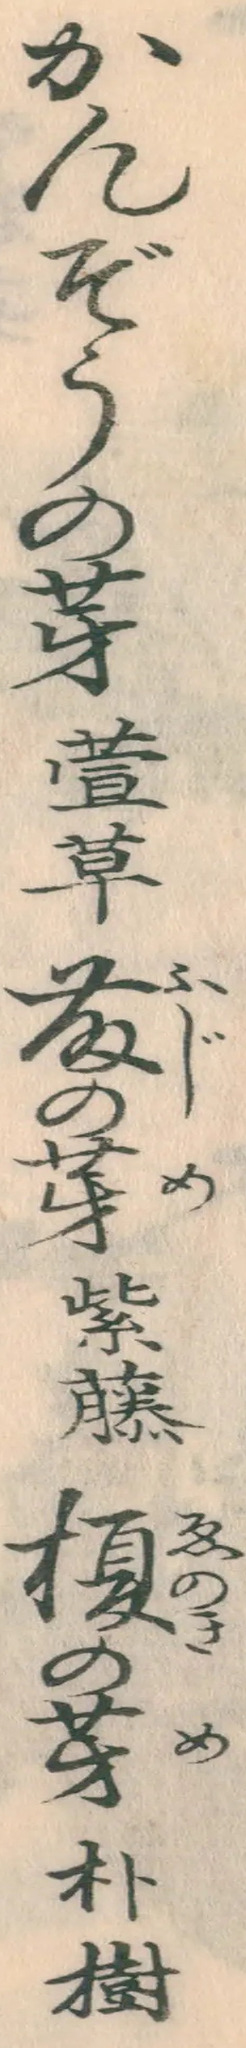かんぞうの芽萱草藤の芽紫藤榎の芽朴樹
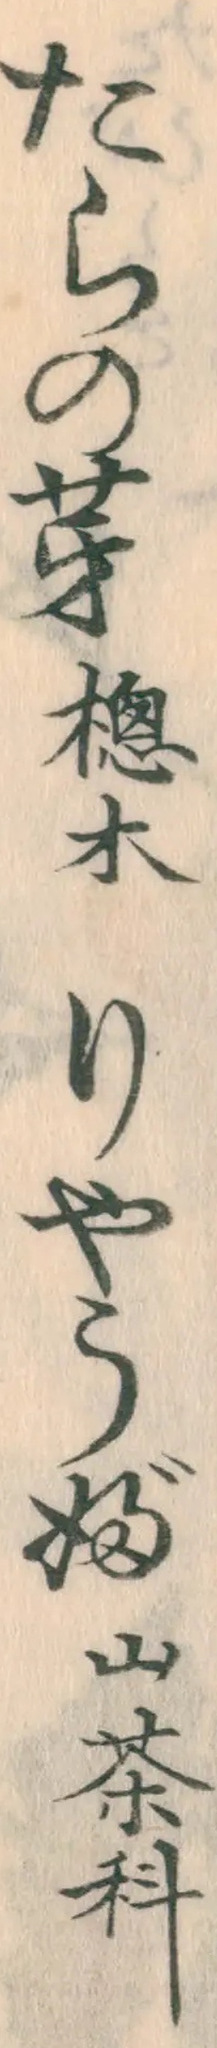たらの芽楤木りやうぶ山茶科
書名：救荒野菜圖説
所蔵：国立国会図書館 National Diet Library, JAPAN
